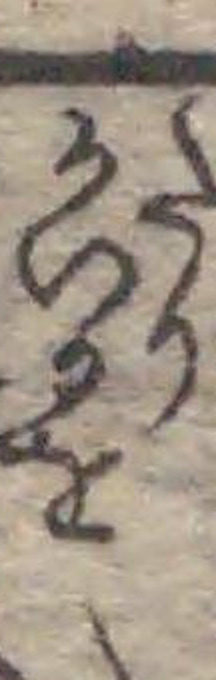かいるを
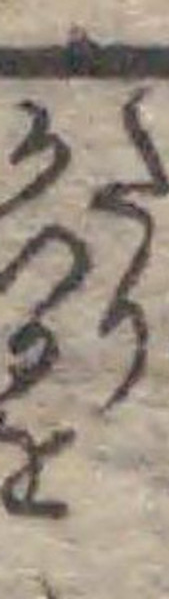かいるを
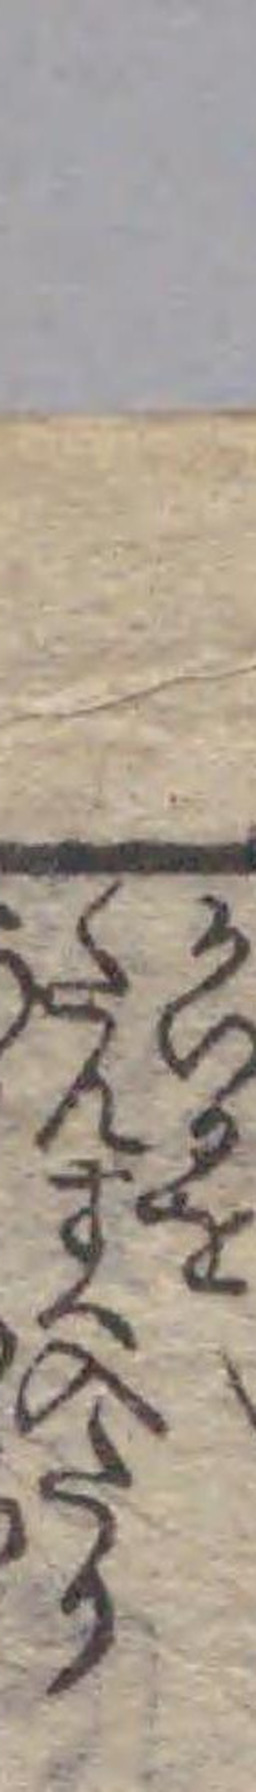たんすへ入たり
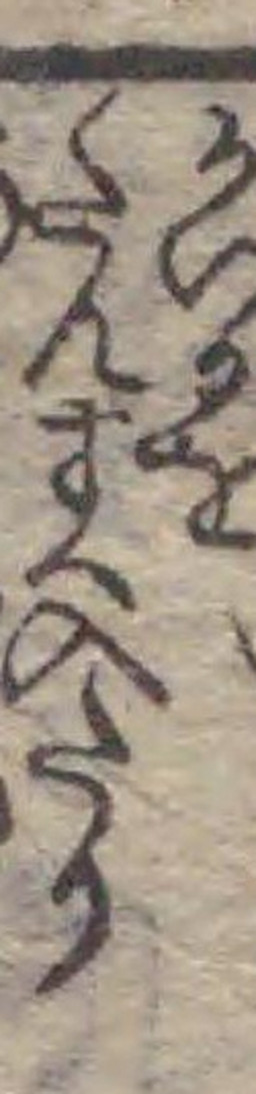たんすへ入たり
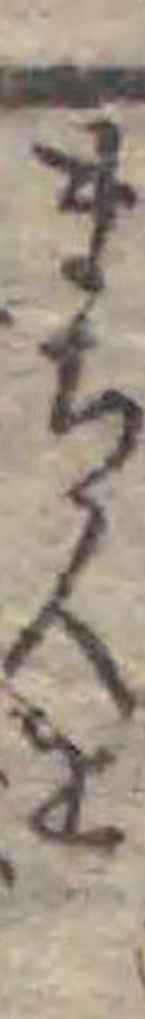まち人を
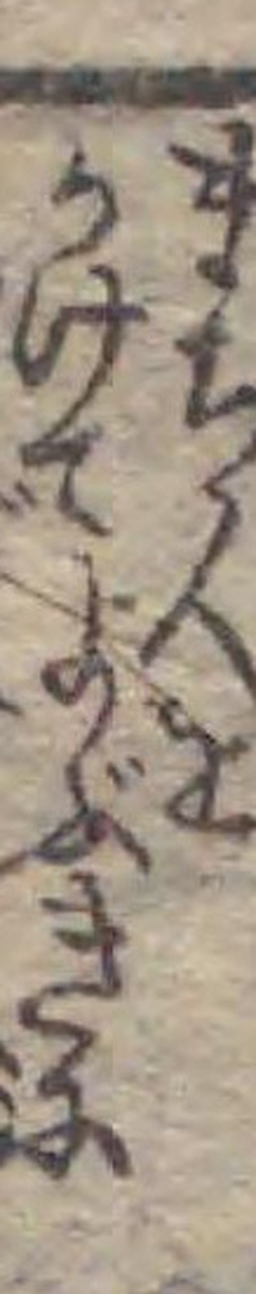かけてよぶきに
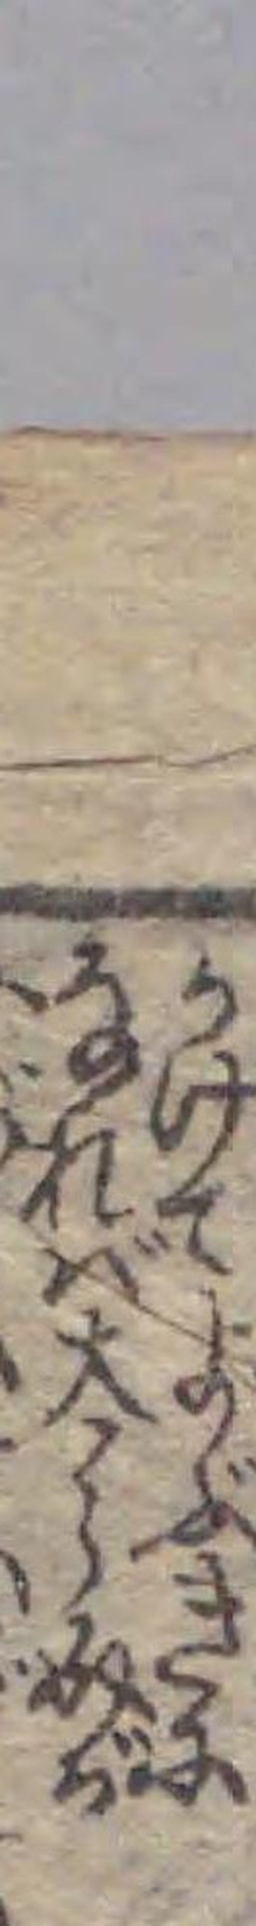なれば太郎介が
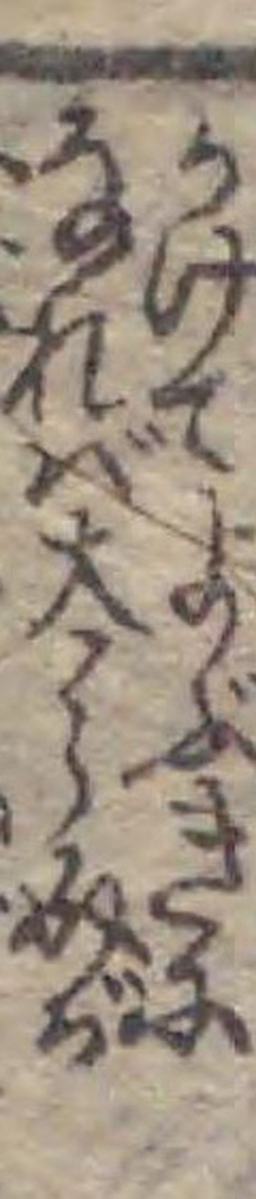なれば太郎介が
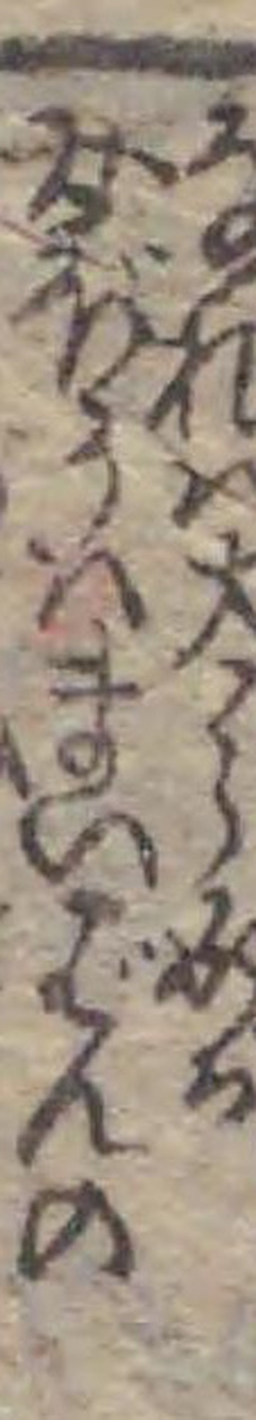女ぼうはまいばんの
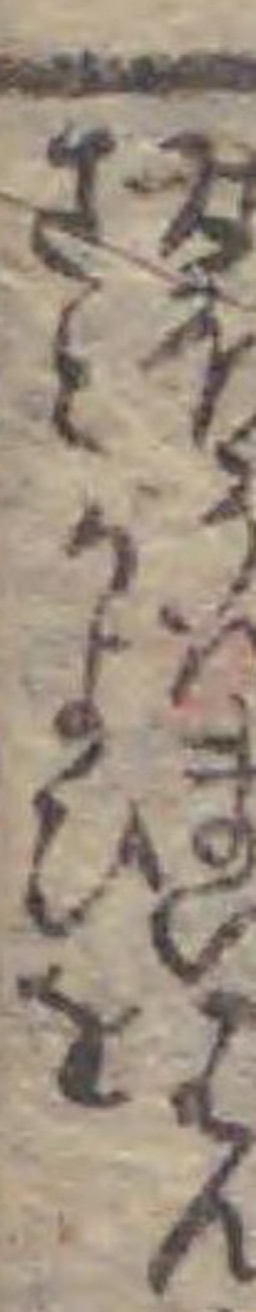さとかよひを
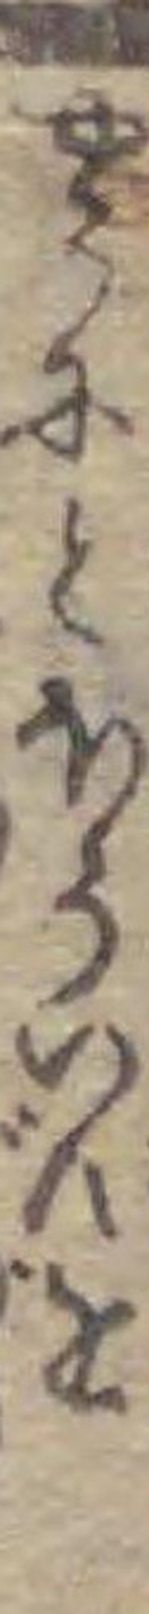やうにとほういんを
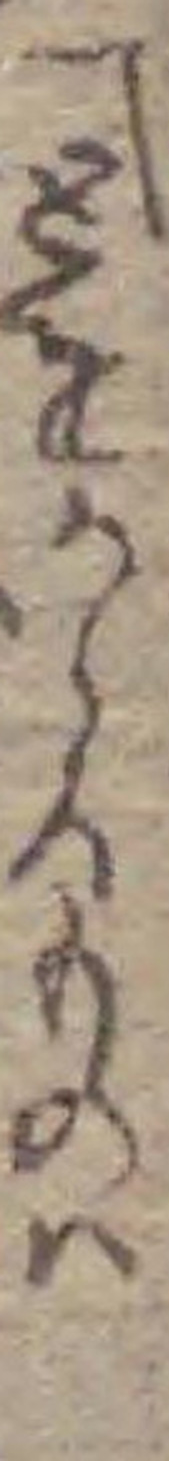〽とをからんものは
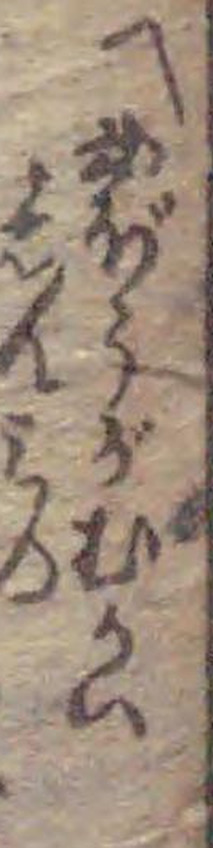〽女ぼうがむかい
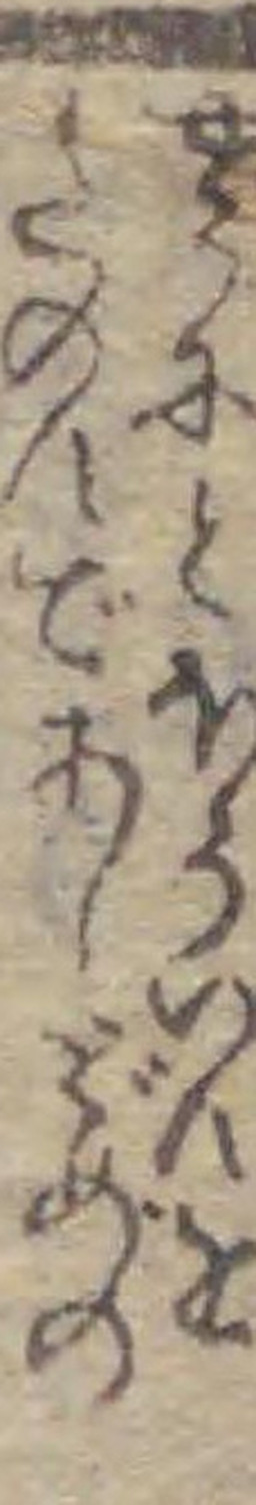たのんであしどめの
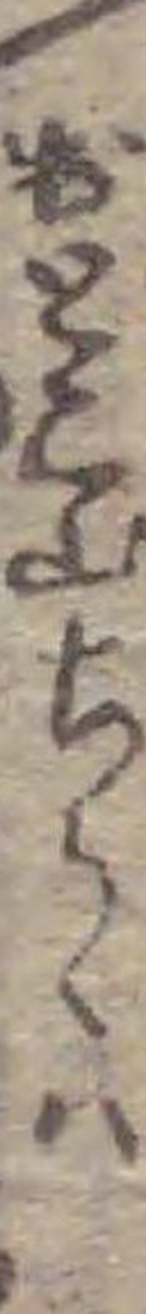おとこ山ちかくは
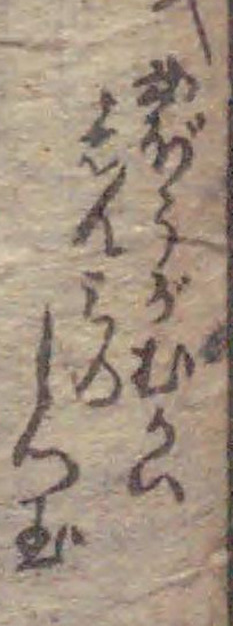〽女ぼうがむかい
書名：四遍搨心学草帋 : 3巻
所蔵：国立国会図書館 National Diet Library, JAPAN
